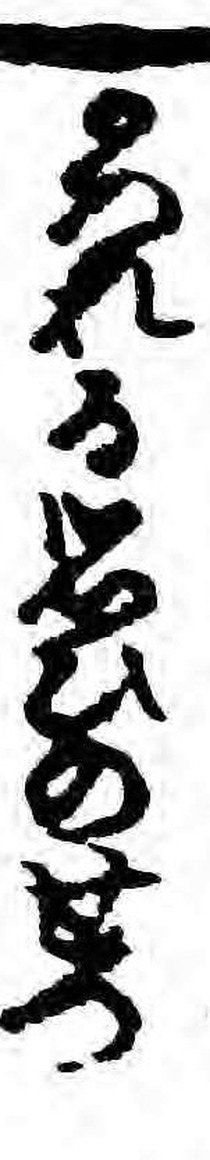かはれる思ひのせつ
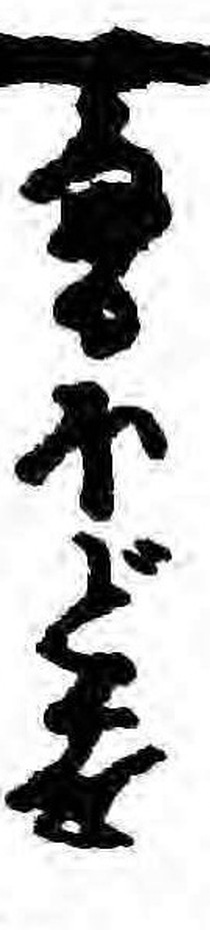なるほどを
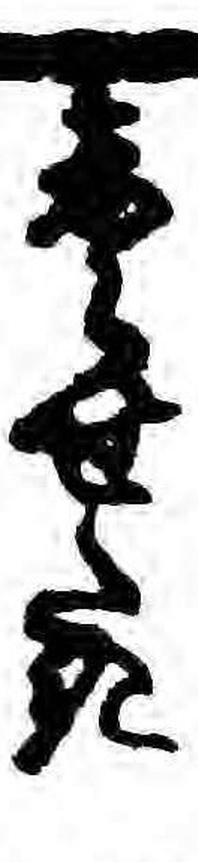しらせたき
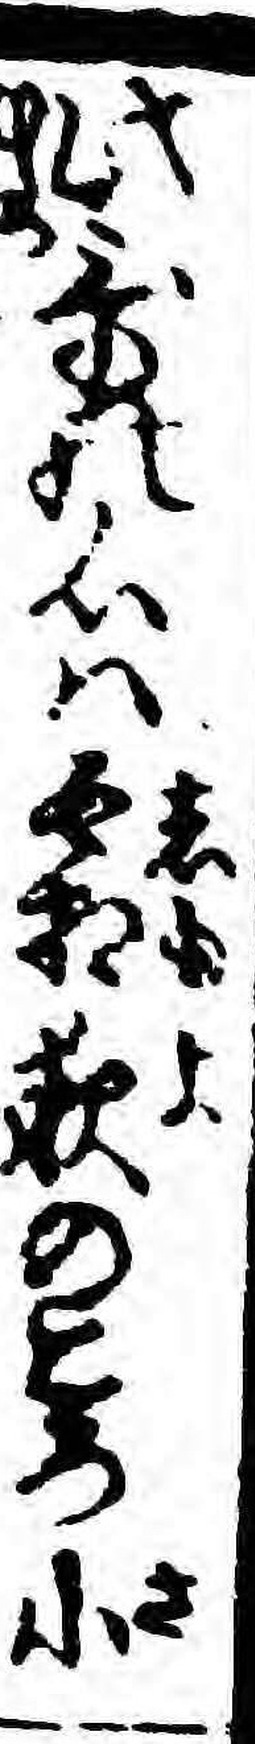此哥の心は霜夜のころ小
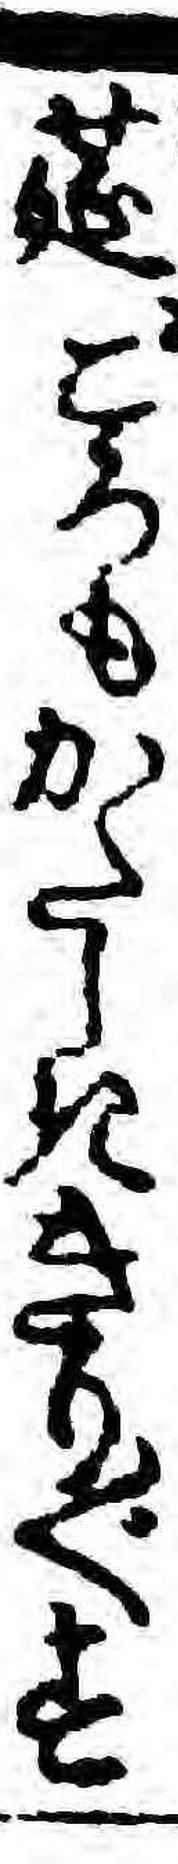筵にころもかたしききり〴〵す
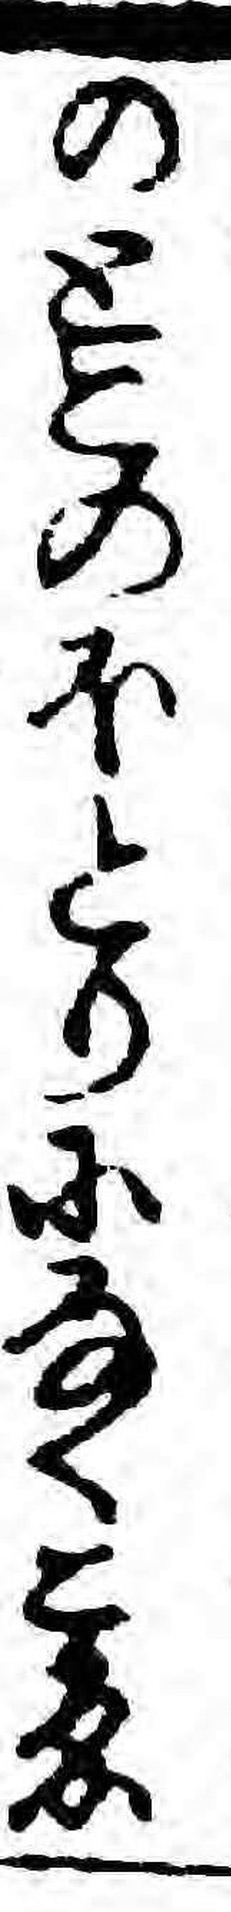のとこのほとりになくこゑ
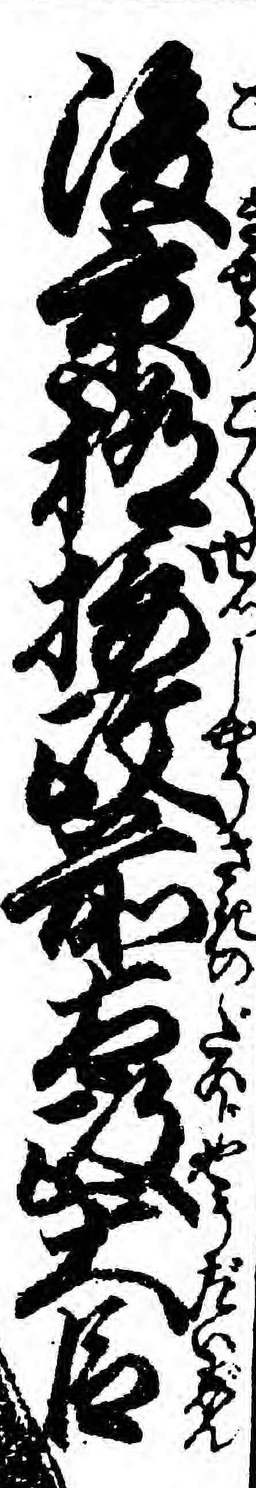後京極摂政前太政大臣
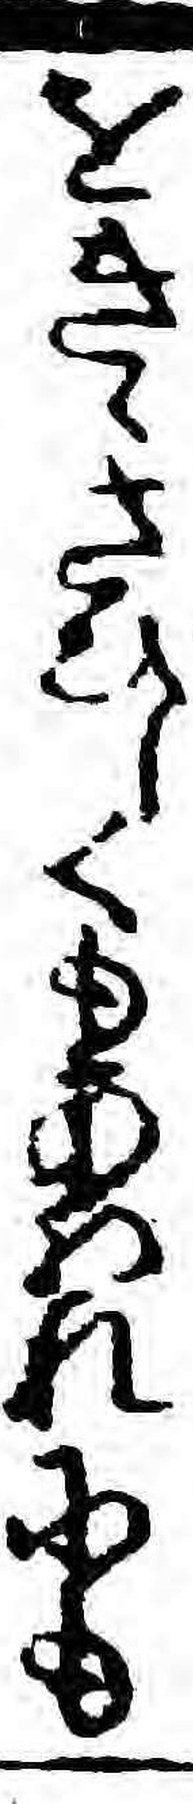をきゝさびしくもあはれにも
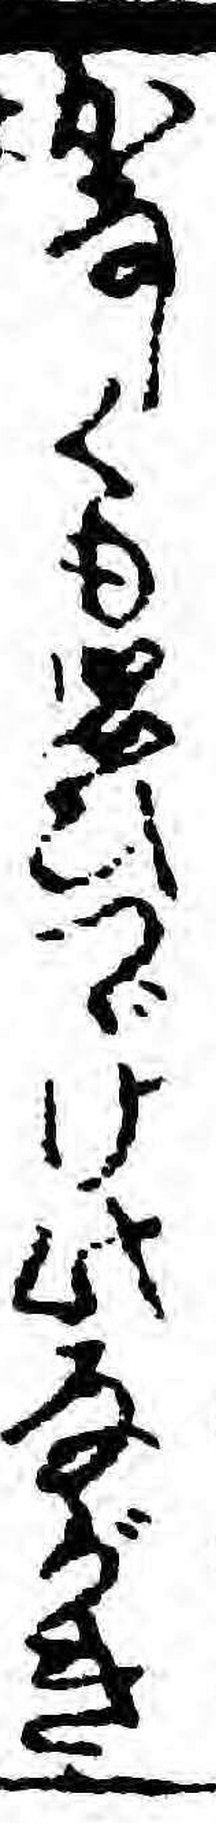かなしく思ひつゞけ此なげき
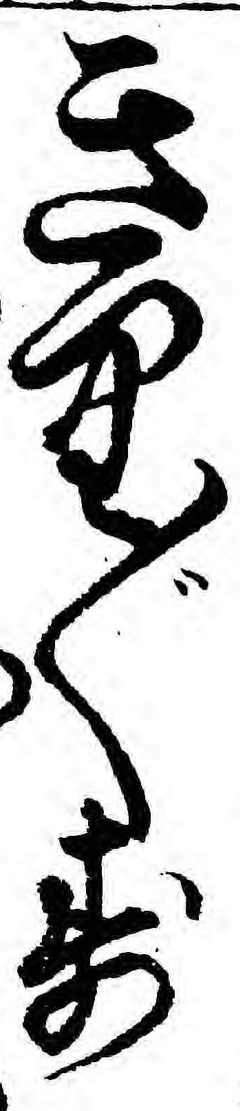きり〴〵す
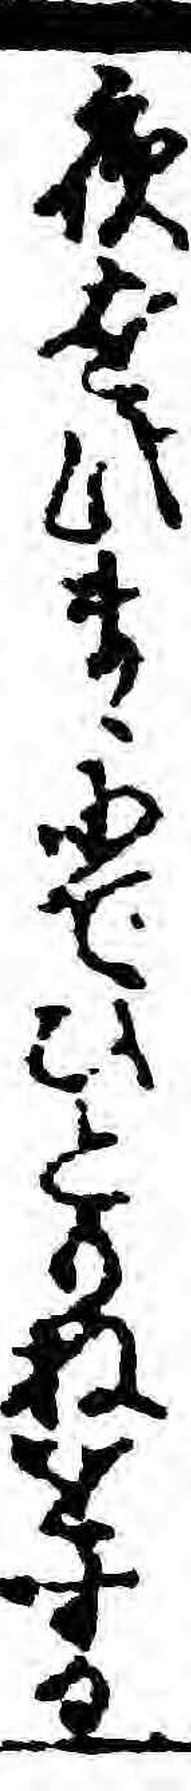夜を此まゝにてひとりねをする
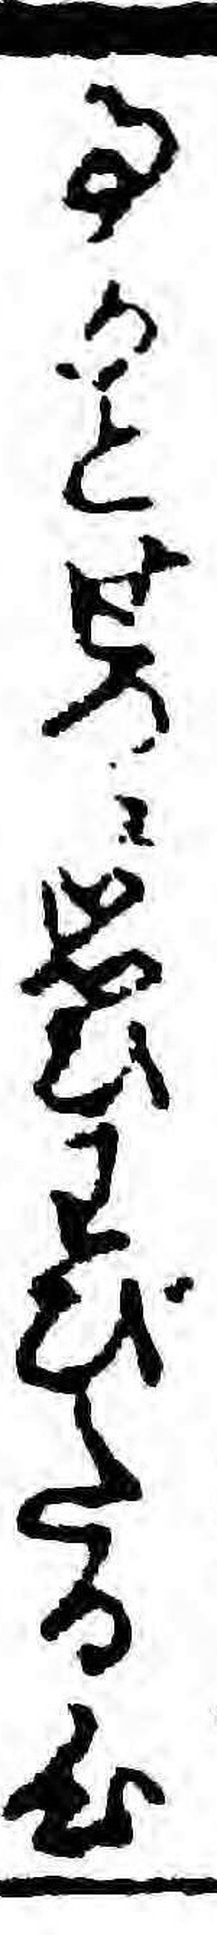事かとせつに思ひわびたる心
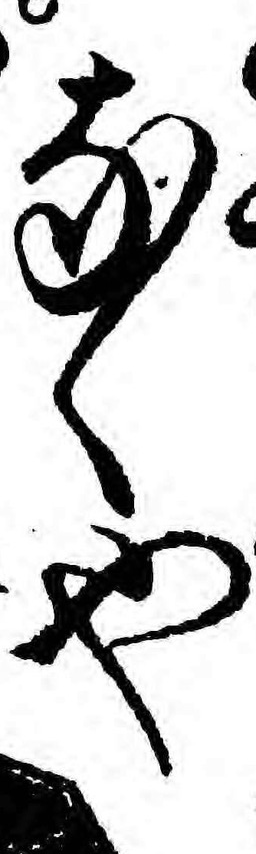なくや
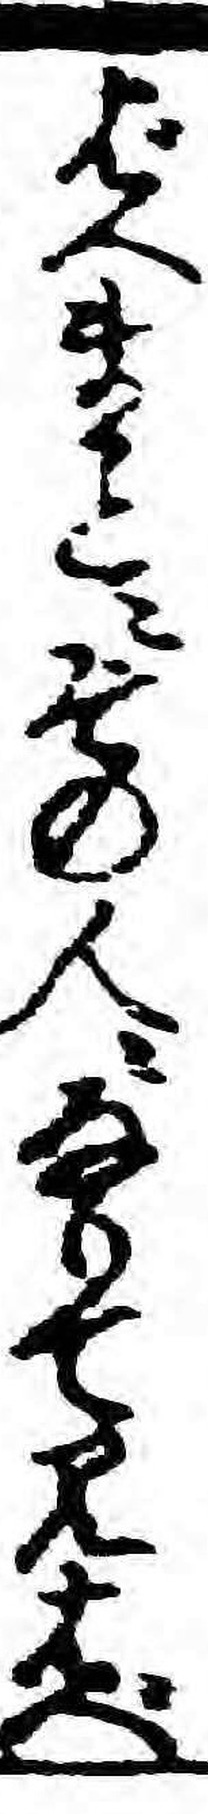ばへまことにその人になりて見はべ
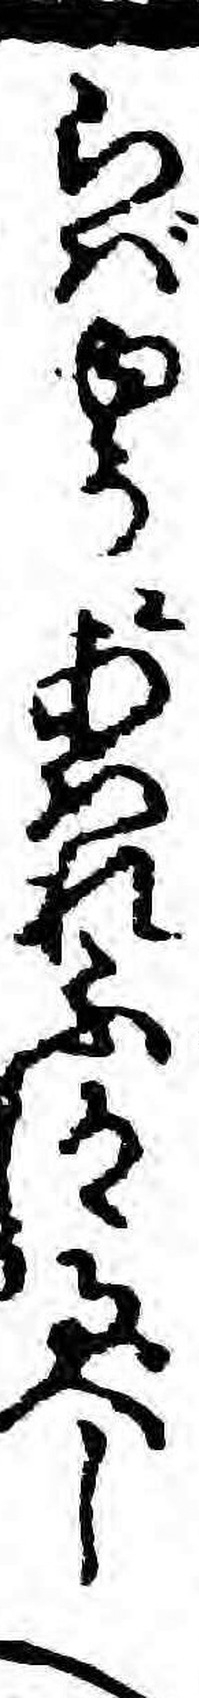らばゆうにあはれふかゝるべし
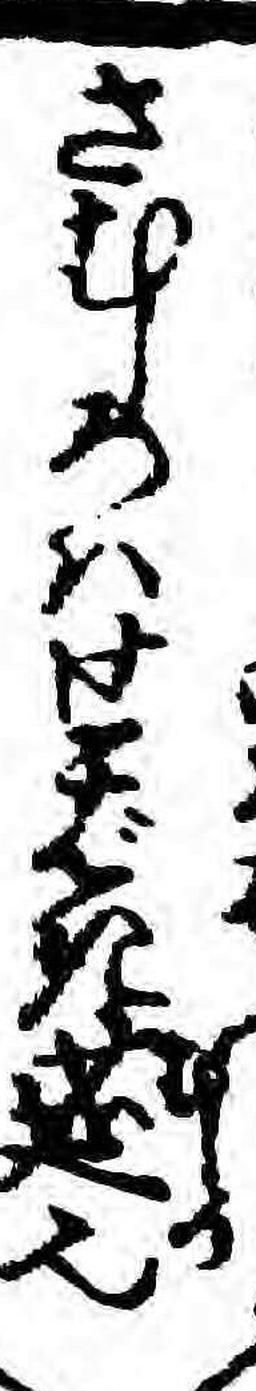さむしろはせばき筵也
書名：頭書和歌注譯／壽賀多百人一首小倉錦
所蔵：国文学研究資料館
